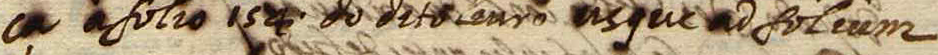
ça a folio 154 do dito liuro usque ad folium
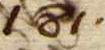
181.
